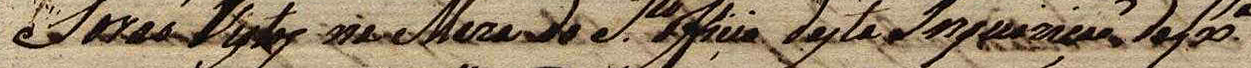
Foraõ Vistos na Meza do S.to Offiçio desta Inquiziçaõ de Lx.a
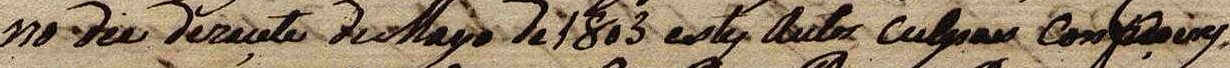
no dia dezaçete de Mayo de 1803 estes Autos culpas confiçoens,
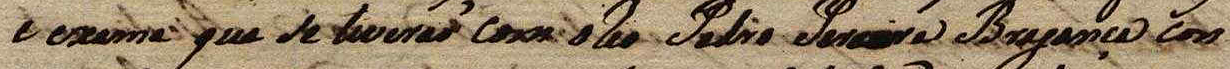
e exame que se tiveraõ com o Reo Pedro Pereira Bragança con
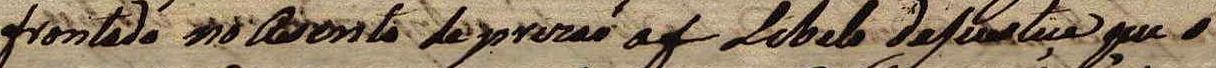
frontado no asento de prezaõ a f Libelo da Justiça que o
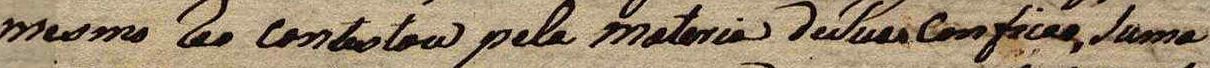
mesmo Reo contestou pela materia de sua confiçaõ, suma
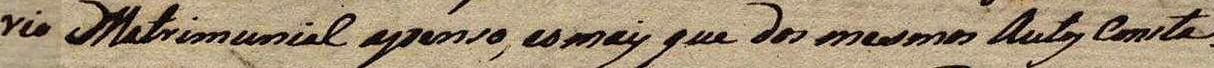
rio Matrimunial apenso, e o mais que dos mesmos Autos consta.
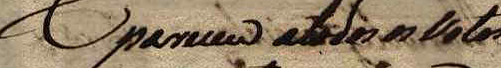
E pareceu a todos os votos
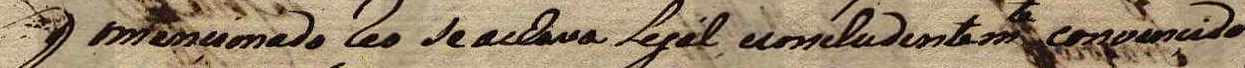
q̄ o mençionado Reo se achava Legal, e concludentem.te convençido
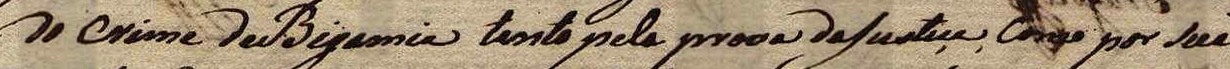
do crime de Bigamia tanto pela prova da Justiça, como por sua
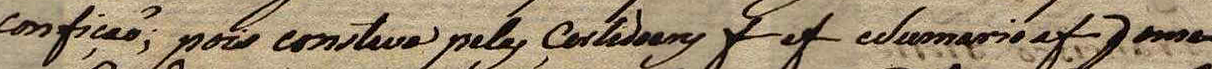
confiçaõ; pois constava pelas certidoens f e f e Sumario a f q̄ o mes
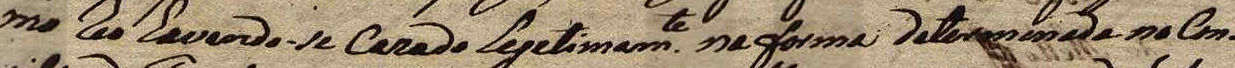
mo Reo havendo-se cazado Legetimam.te na forma determinada no Con
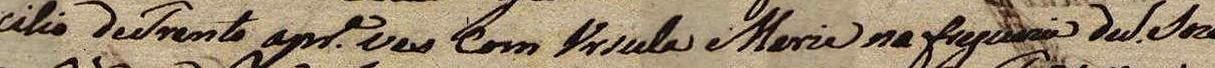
cilio de Trento a pr.a ves com Vrsula Maria na freguezia de S. Ioze
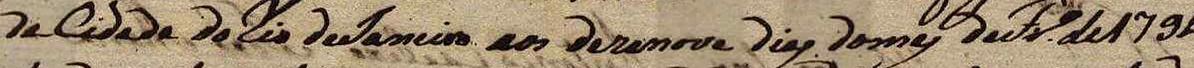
da Cidade do Rio de Janeiro aos dezanove dias do mes de Fr.o de 1791
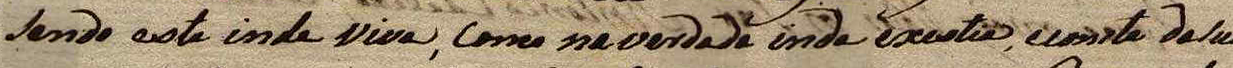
sendo esta inda viva, como na verdade inda exestia, e consta da sua
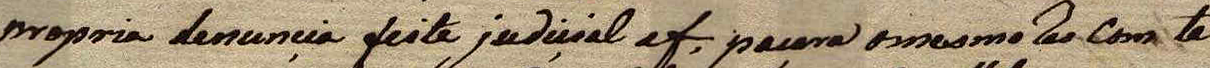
propria denunçia feita, judicial a f, paçara o mesmo Reo com te
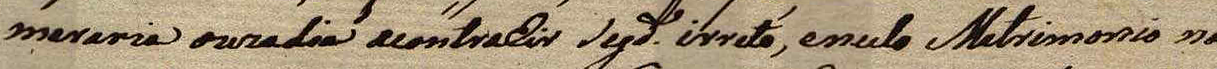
meraria ouzadia a contrahir segd.o irreto, e nulo Matrimonio na
